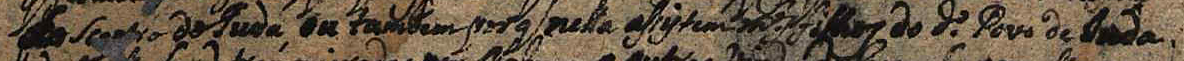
do se_tro de Iuda, ou tambem porq̄ nella assistem m.tos filhos do d.o Povo de Iuda
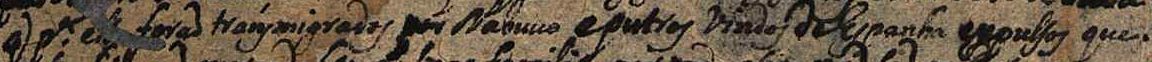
q̄ p.a e_ foraõ transmigrados por Nabucco e outros vindos de Espanha expulsos que
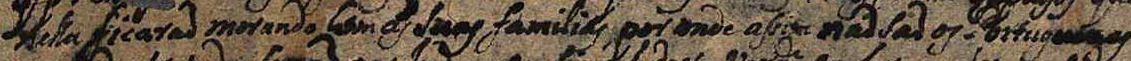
nella ficaraõ morando Com as suas familias, por onde assim naõ saõ os. Portugueses
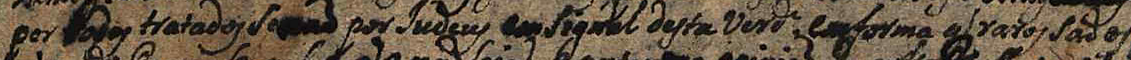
por todos tratados senaõ por Iudeus em signal desta Verd.e em forma q̄ raros saõ os
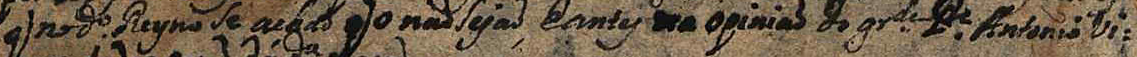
q̄ no d.o Reyno se achaõ q̄ o naõ sejaõ, e antes na opiniaõ do gr.de P.e Antonio Vi
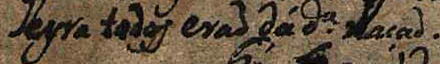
eyra todos eraõ da d.a naçaõ.
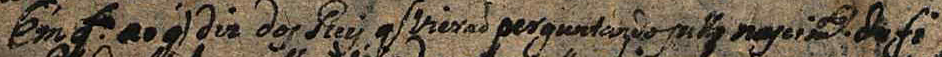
Emq.to ao q̄ diz dos Reis q̄ vieraõ perguntando pello nascim.to do fi
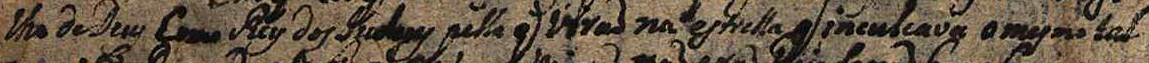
lho de Deus Como Rey dos Iudeus pello q̄ viraõ na estrella q̄ inculcava o mesmo tal
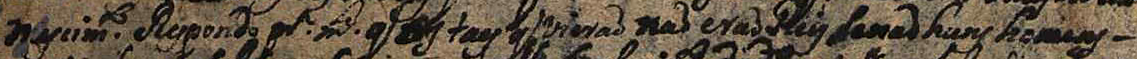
nascim.to e Respondo pr.am.te q̄ os taes q̄ vieraõ naõ eraõ Reis senaõ huns homens
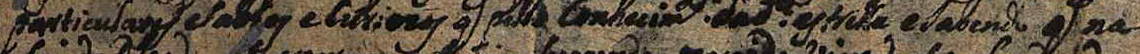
particulares sabios e Curiozos q̄ pello Conhecim.to da d.a estrella e sabendo q̄ na
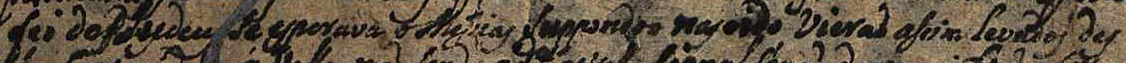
scido _deu se esperava o Messias suppondoo nascido vieraõ assim levados des
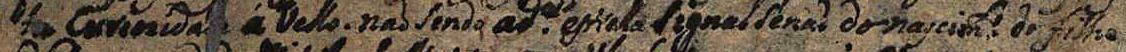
ta Curiozida_ a vello. naõ sendo a d.a estrella signal senaõ do nascim.to do filho
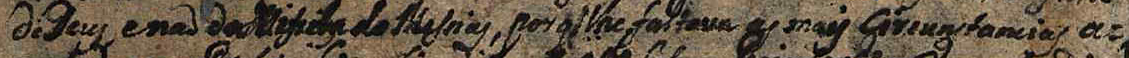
de Deus, e naõ da _isi_a do Messias, porq̄ lhe faltaua as mais circunstancias a
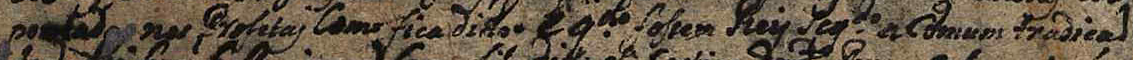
pontad_ nos Profetas Como fica ditto. E q.do fossem Reis seg.do a Comum tradiçaõ
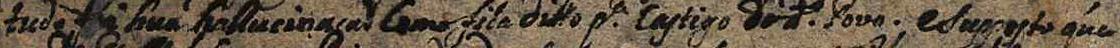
tudo _ huā hallucinaçaõ Como fica ditto p.a castigo do d̄.o Povo; e supposto que
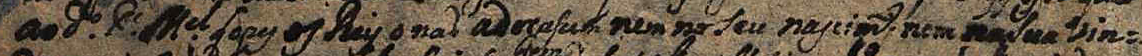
ao d.o P.e M.el Lopes os Reis o naõ adorassem nem no seu nascim;to nem na sua vin
